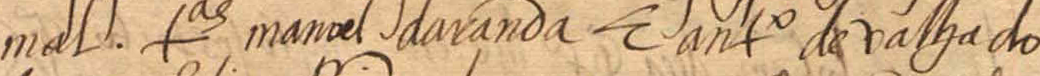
maL. tas manoel daranda E anto de valhado
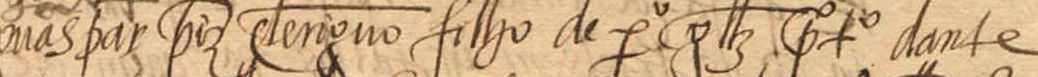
guaspar p̅iz c̅leriguo filho de ꝑo g̅llz p̄o to dante
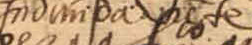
Jndiuidame̅te
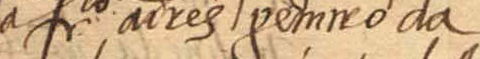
a frco aires gemrro da
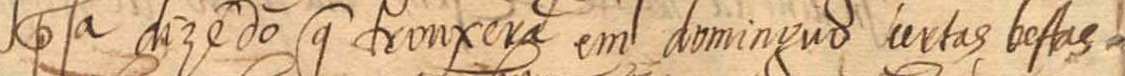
p̄sa dize̅do q̅ trouxera em dominguo certas bestas
